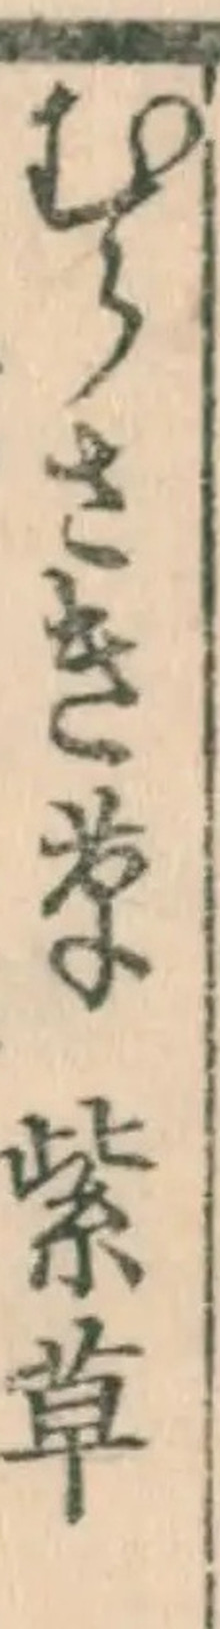むらさき草紫草
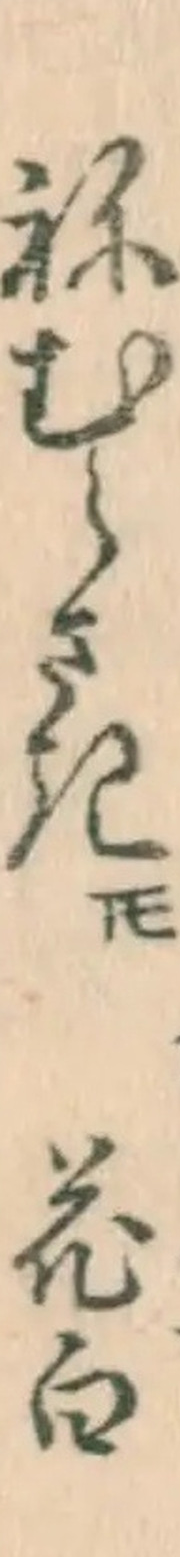ねむらさき共花白
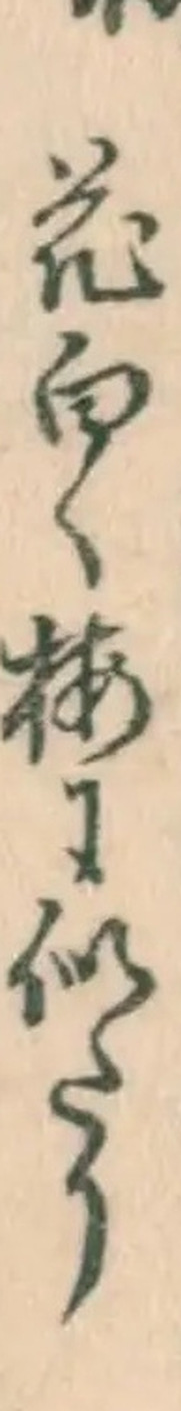花白く梅に似たり
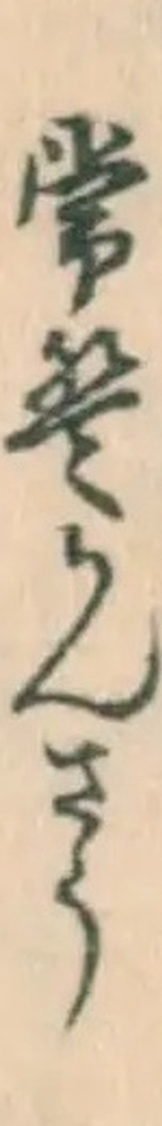常豊かんさう
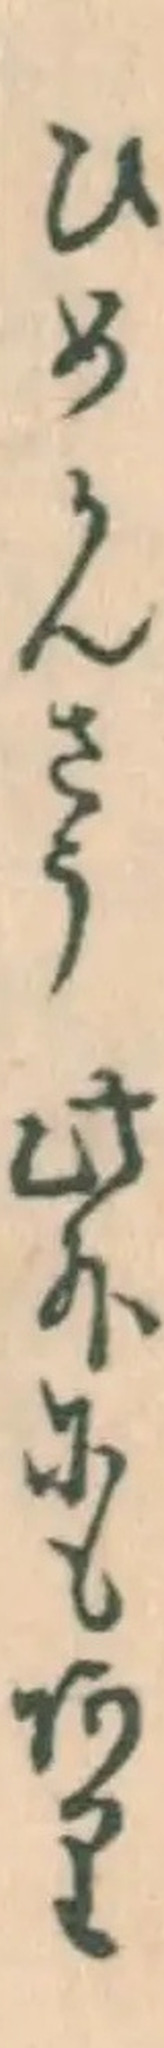ひめかんさい此外にもあり
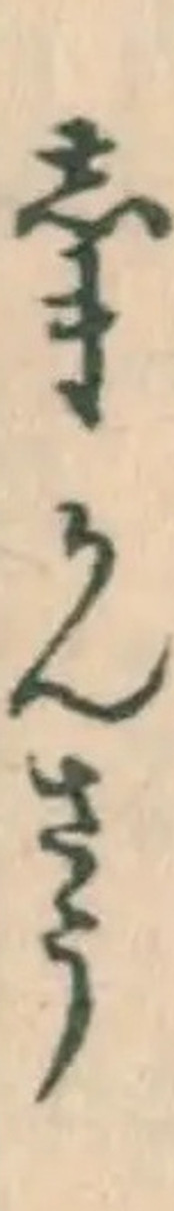しまかんさう
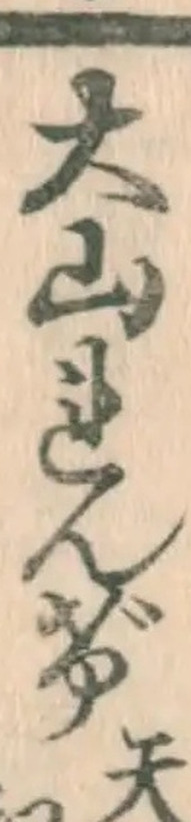大山れんげ
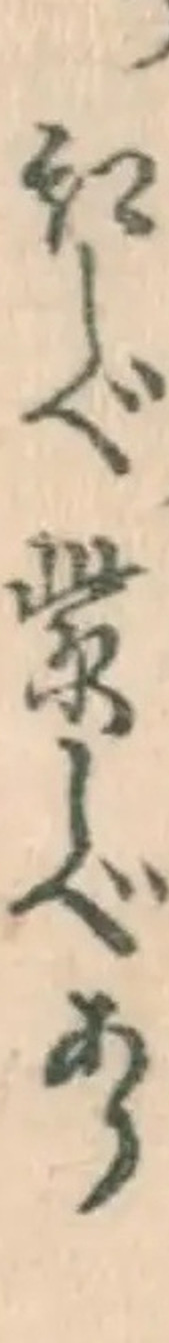紅しべ紫しべあり
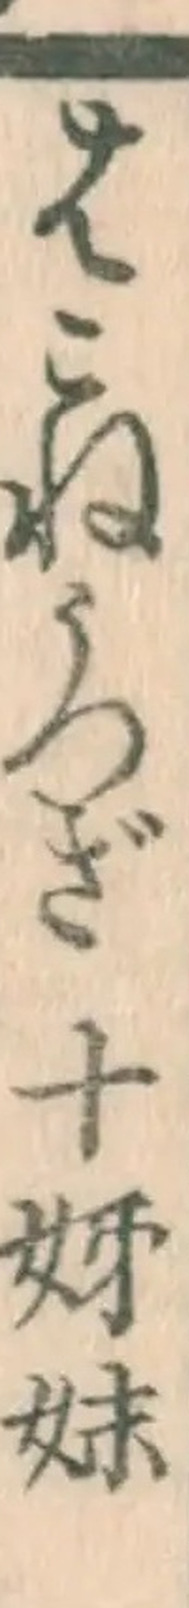はこねうつぎ十姉妹
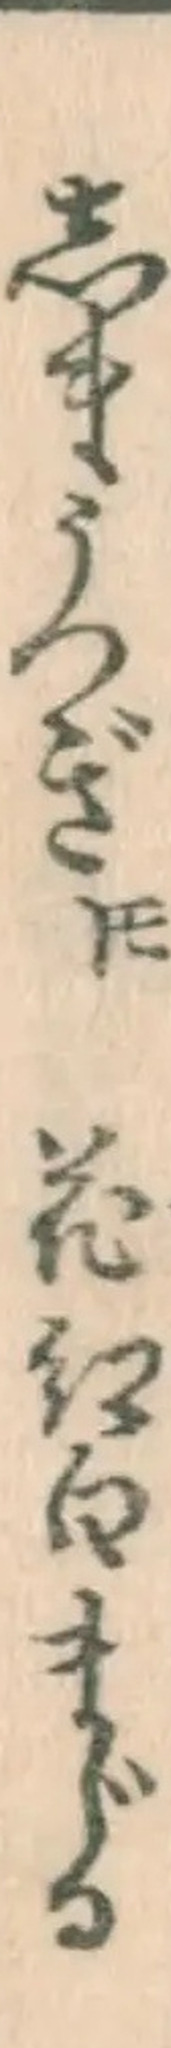しまうつぎ共花紅白まじる
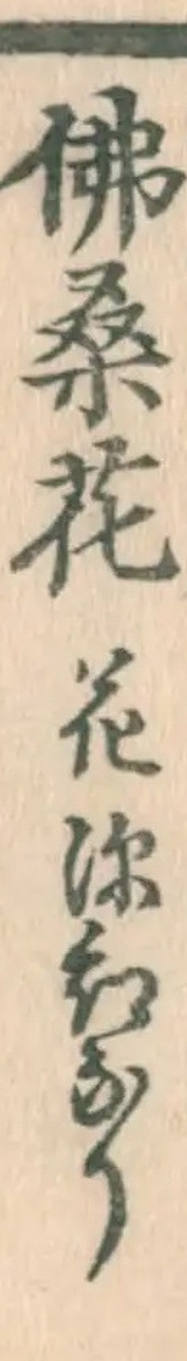佛桑花花深紅なり
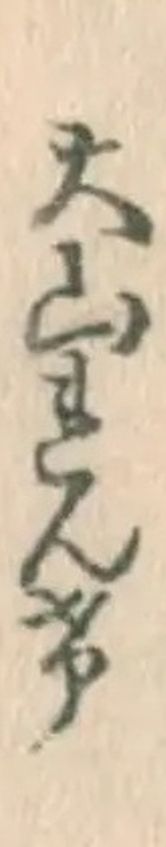大山れんげ
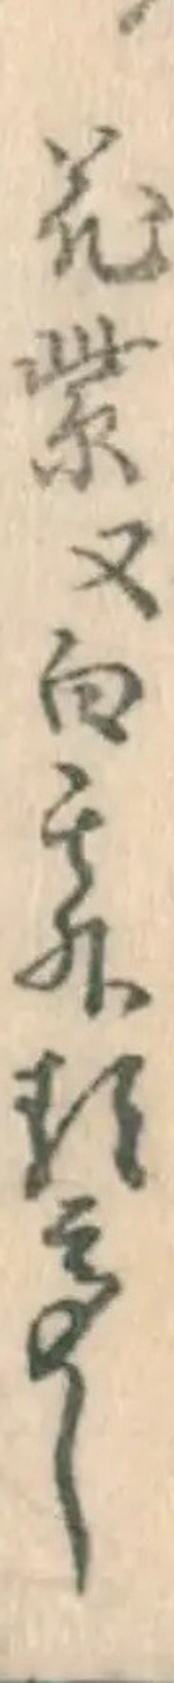花紫又白みな類多し
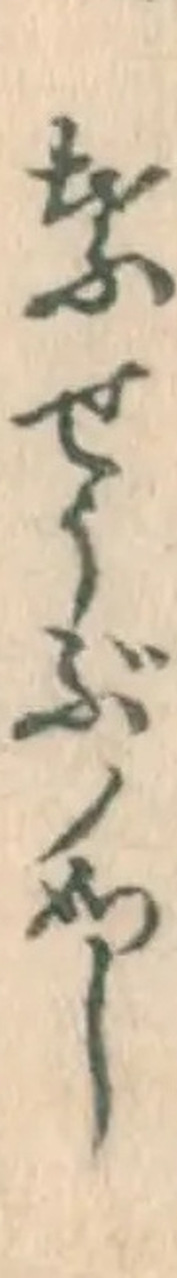葉ハせうぶの如し

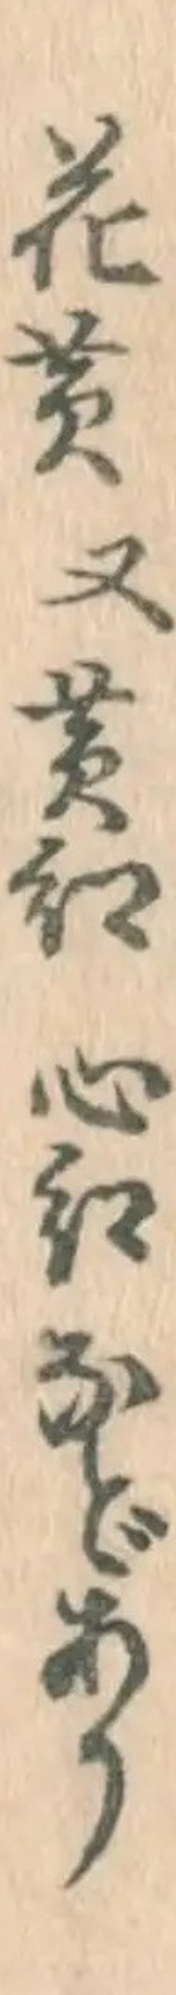花黄又黄赤深紅などあり
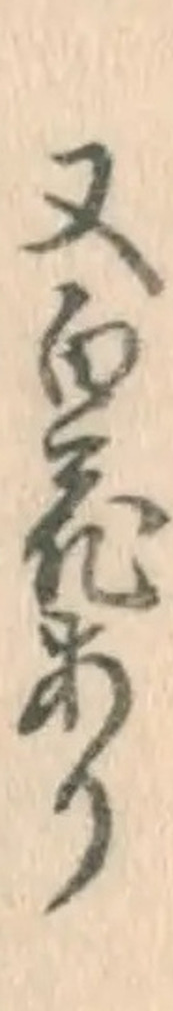又白花あり
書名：茶席挿花集
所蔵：国立国会図書館 National Diet Library, JAPAN
